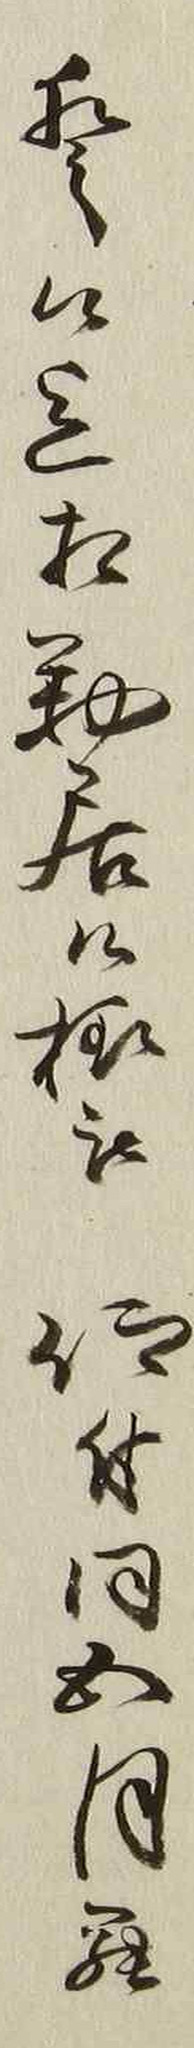登候迄相勤居侯様被仰付同五月罷
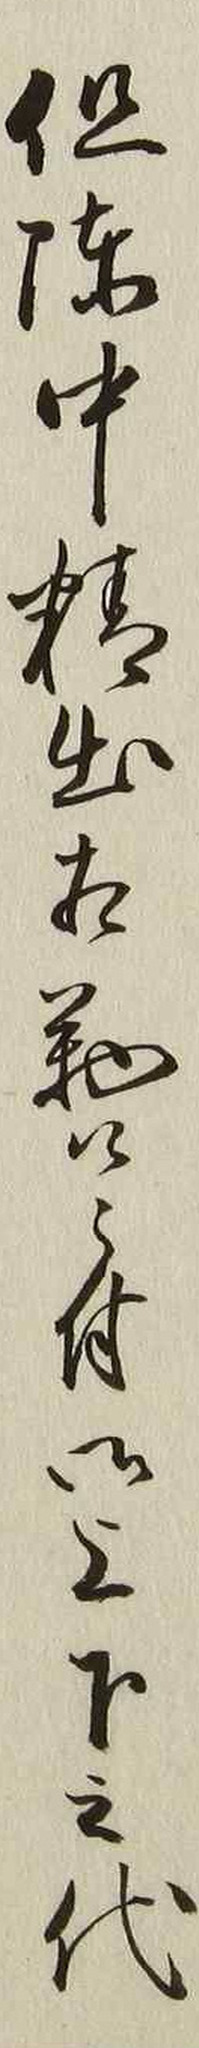但陣中精出相勤候ニ付御上下之代
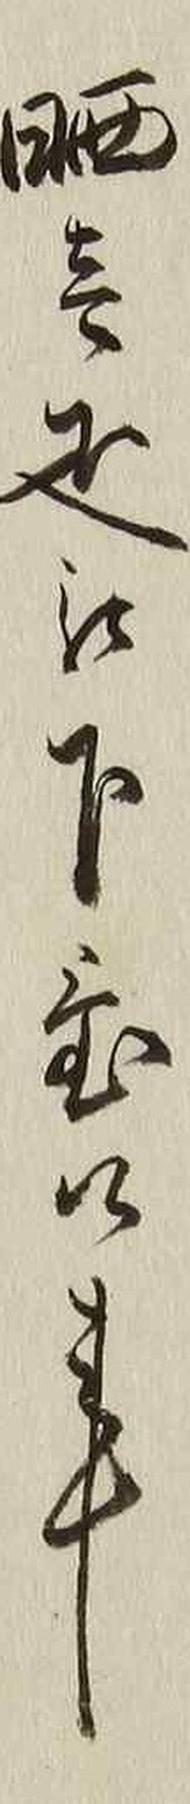晒壱疋被下置候事
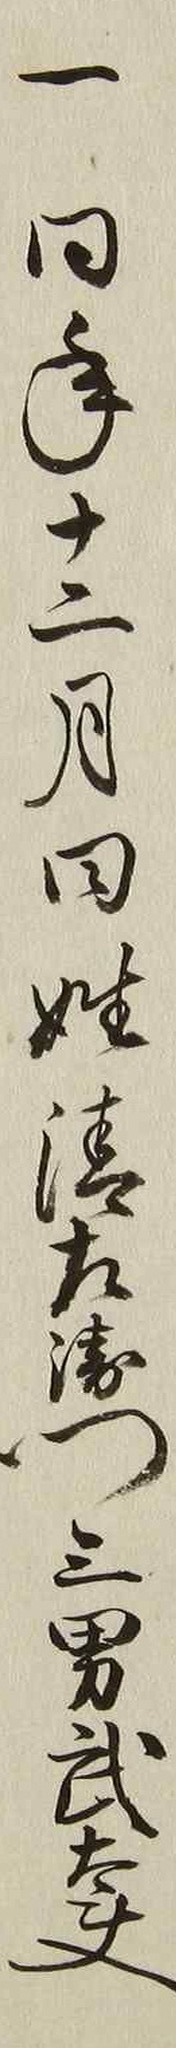一同年十二月同姓清左衛門三男武太夫
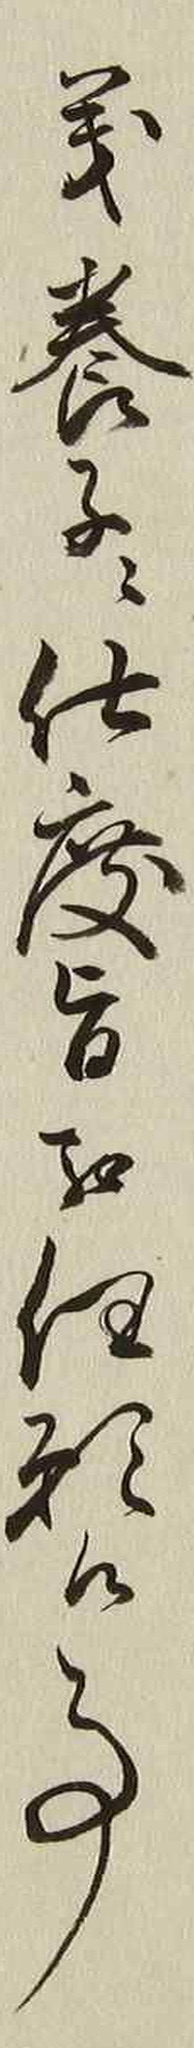義養子ニ仕度旨被任願候事
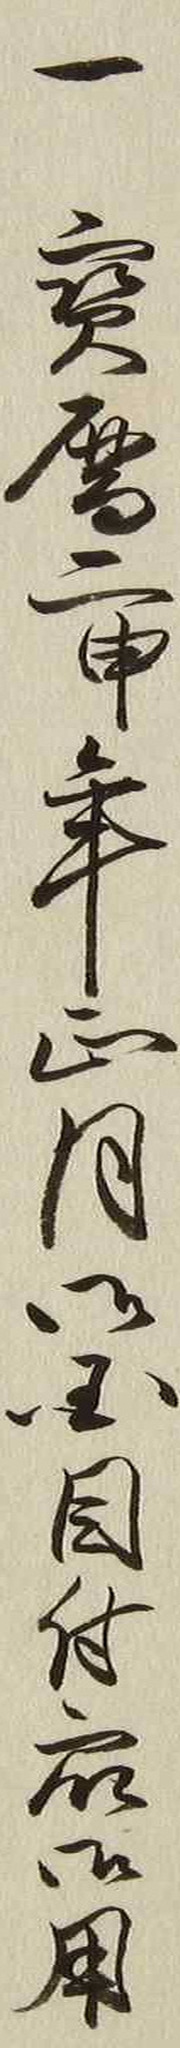一宝暦二申年正月御国目付衆御用
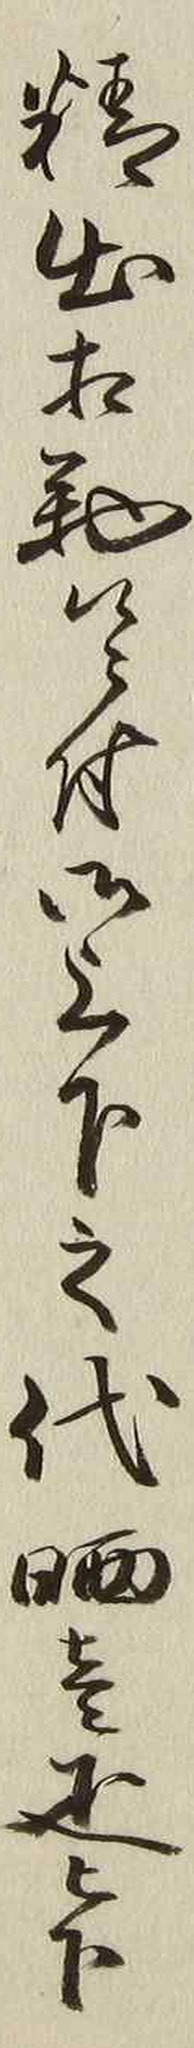精出相勤候ニ付御上下之代晒壱疋被下
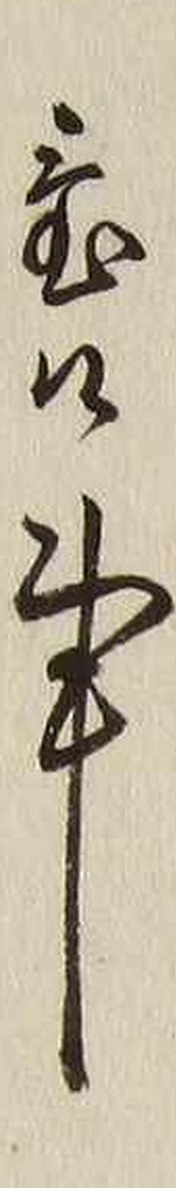置候事
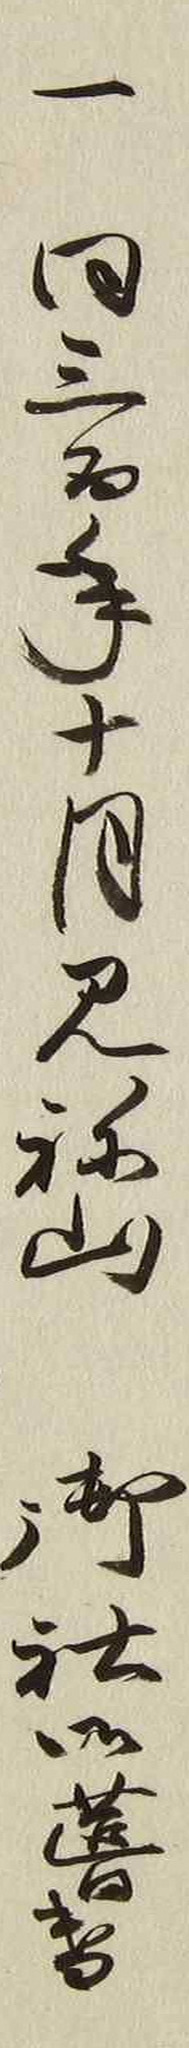一同三酉年十月見祢山御社御葺替
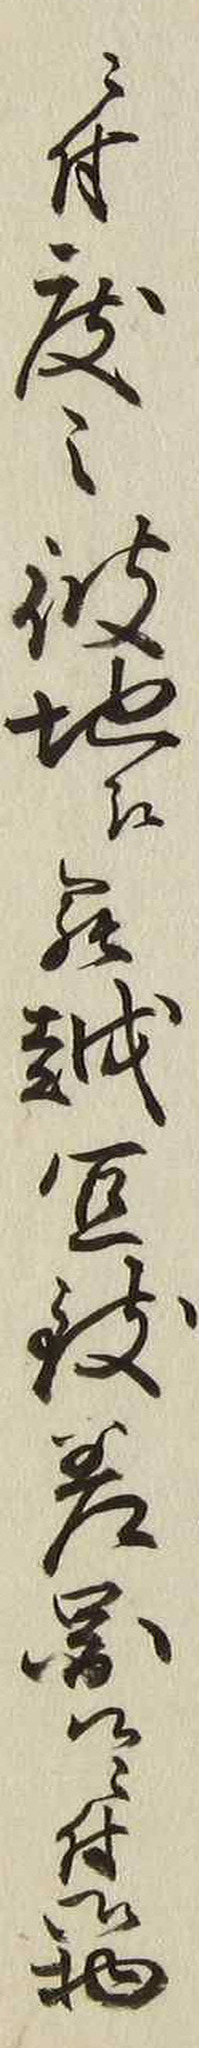ニ付度々彼地江罷越宜致差図候ニ付御物
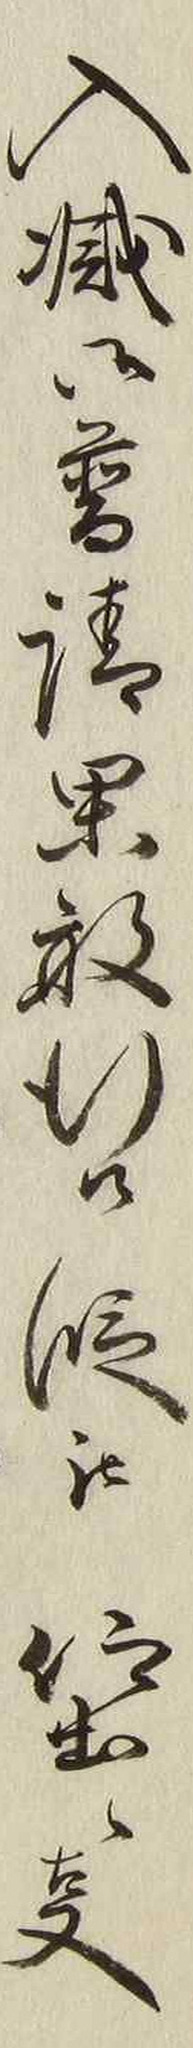入減御普請果敢行候段被仰出候事
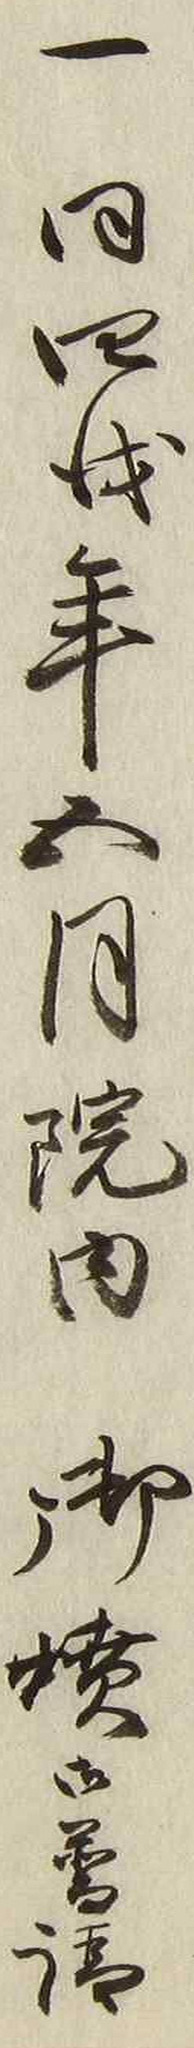一同四戌年五月院内御墳御普請
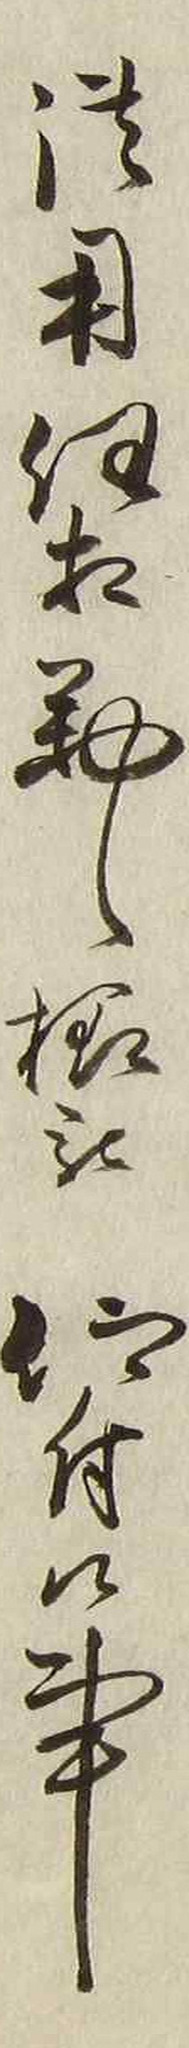御用任相勤候様被仰付候事
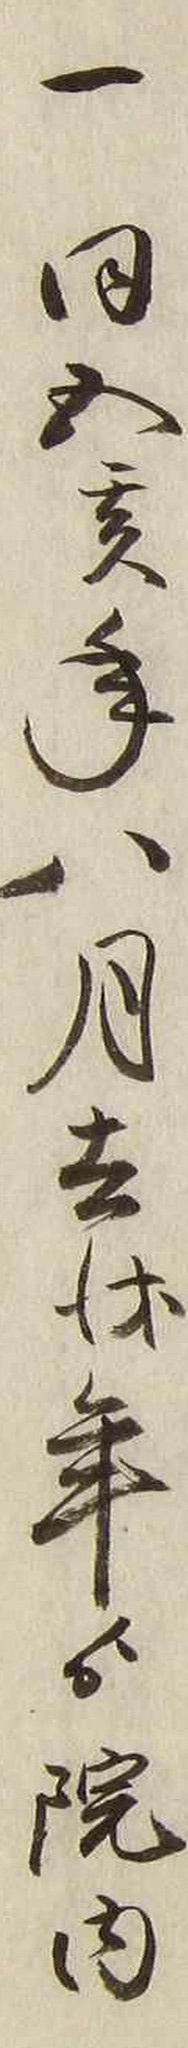一同五亥年八月去戌年ゟ院内

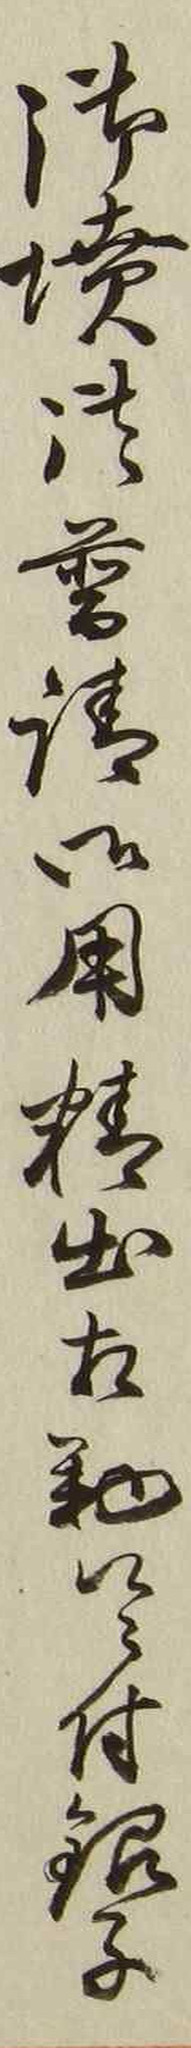御墳御普請御用精出相勤候ニ付銀子
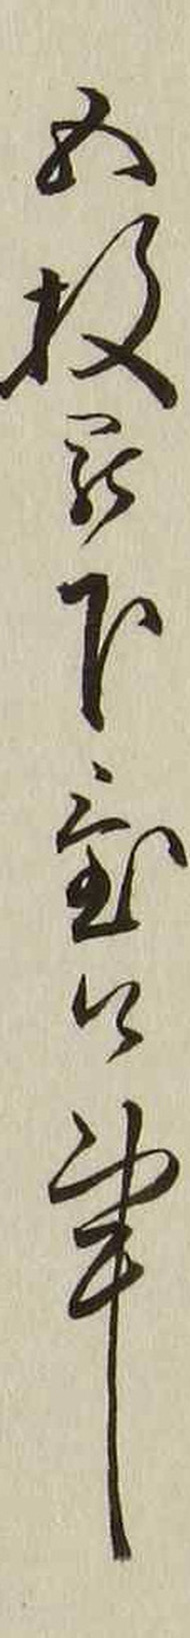五枚被下置候事
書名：諸士系譜　巻之21　い之部21
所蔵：会津若松市立会津図書館
